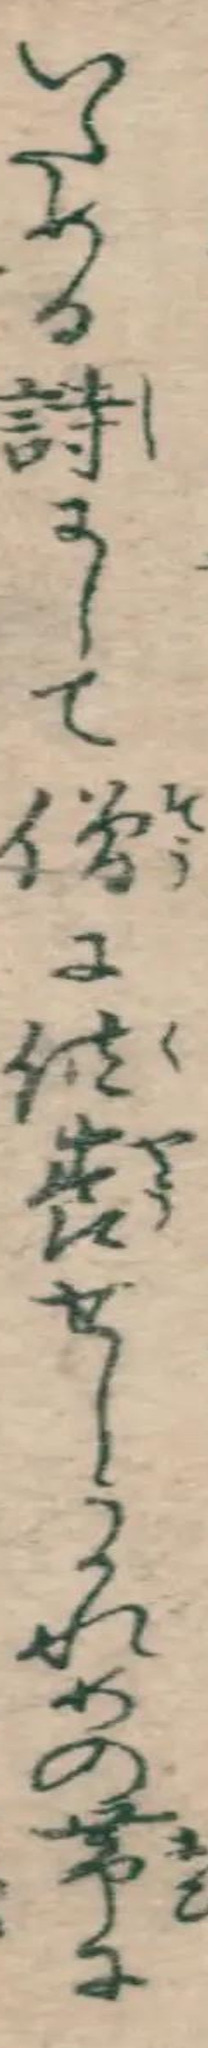いためる詩にして僧に供養せしうかれめの帯に
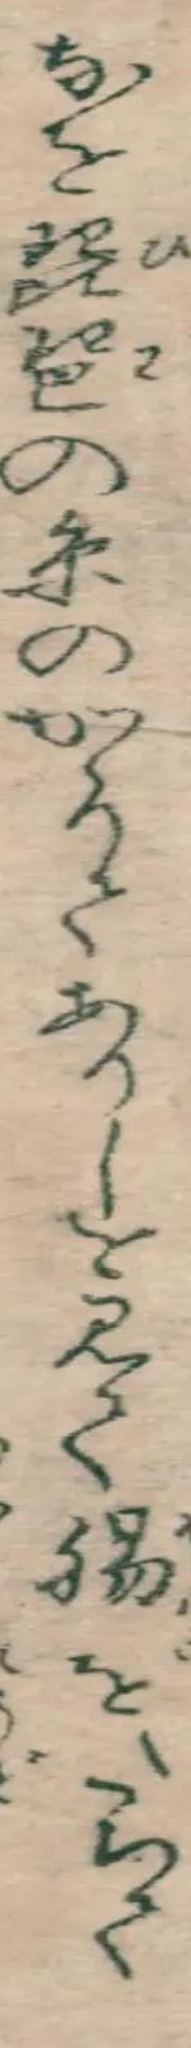なを琵琶の糸のかゝりてありしを見て腸をたちて
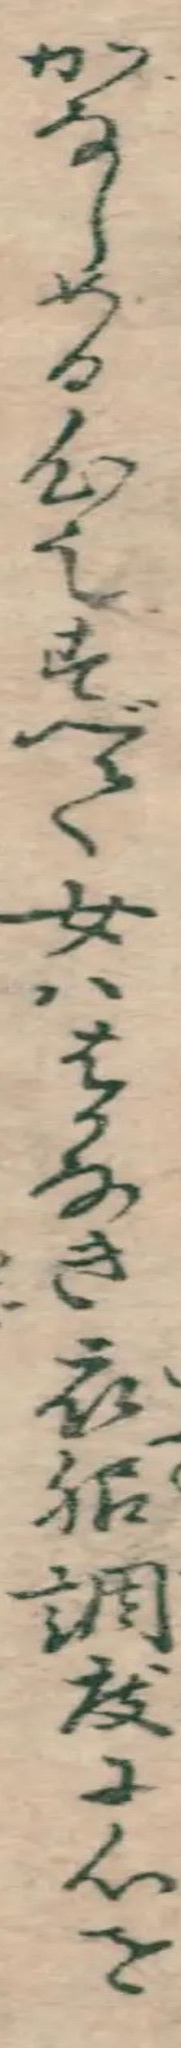かなしめる心也すべて女ははかなき衣服調度に心を
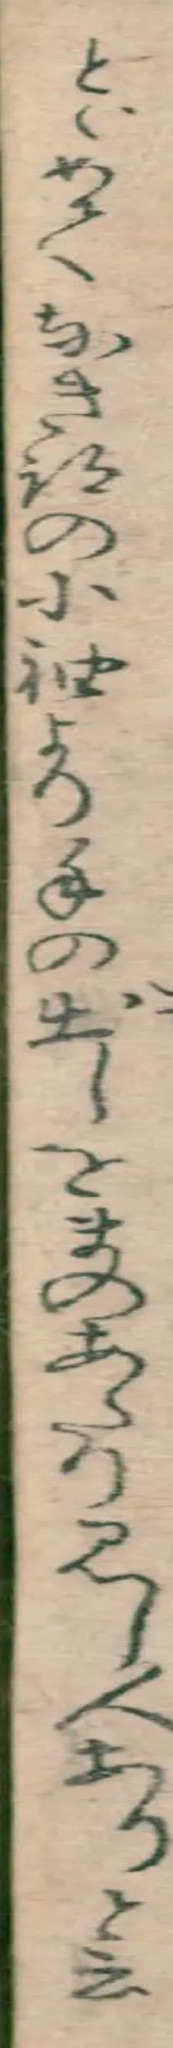とゞめてなき跡の小袖より手の出しをまのあたり見し人ありと云
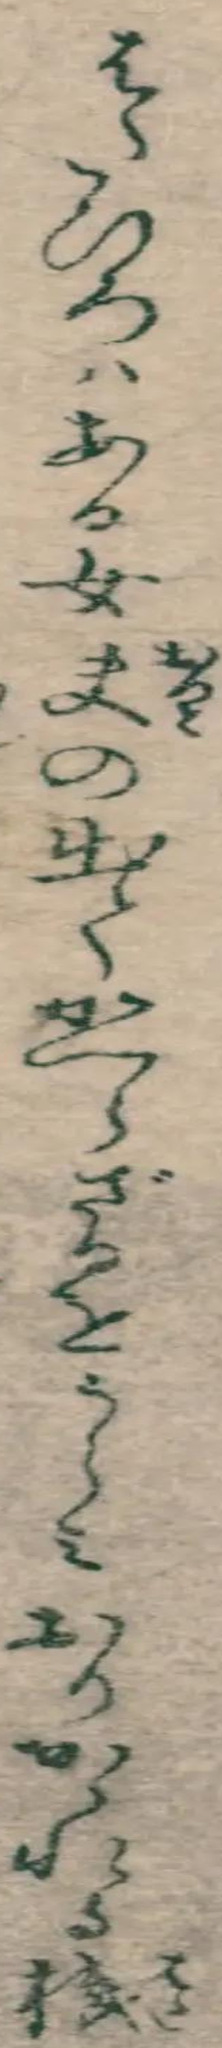はたひろはある女の夫の出てかへらざるをうらみおりかゝれる機
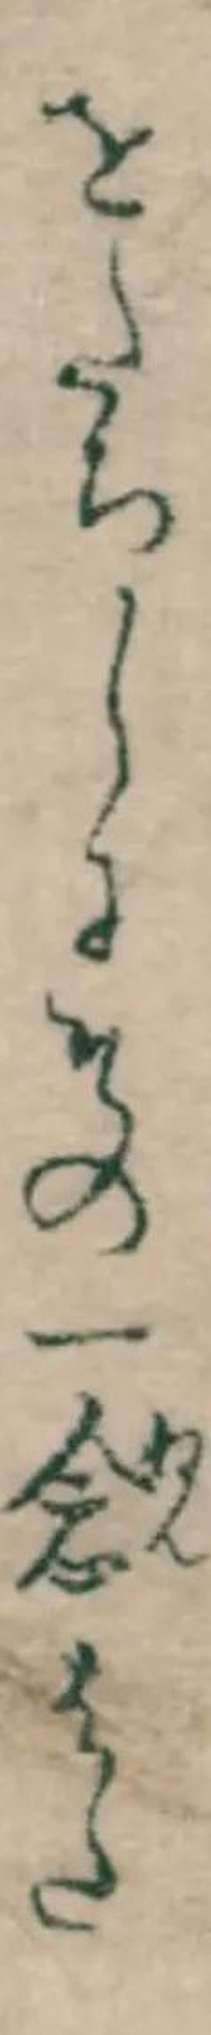をたちしにその一念はた
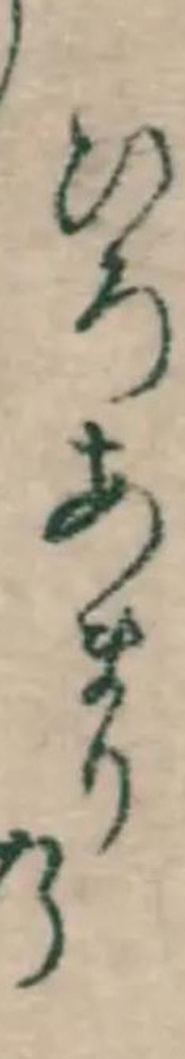ひろあまりの
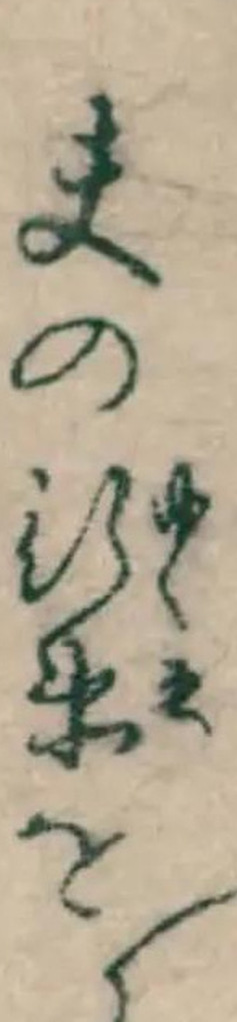夫の行衛を
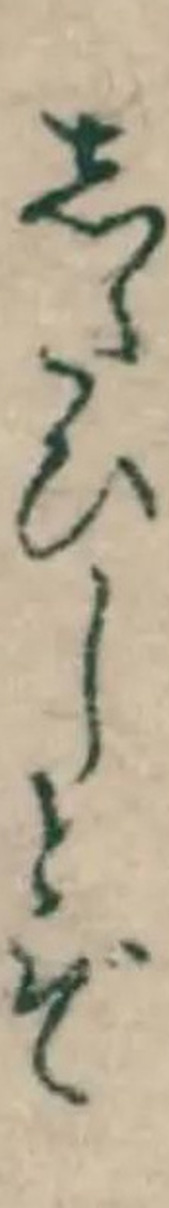したひしとぞ
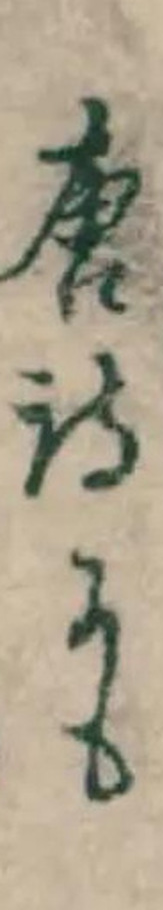唐詩にも
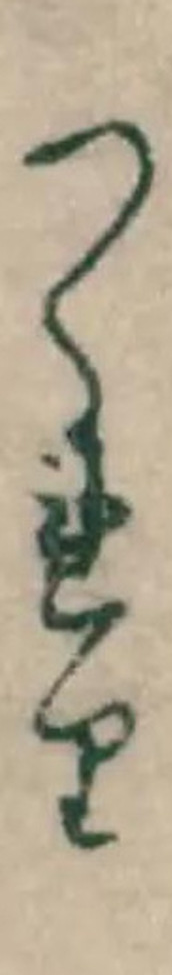つくれり

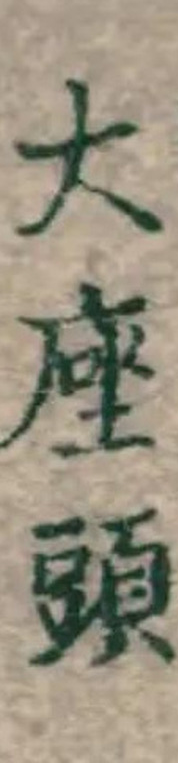大座頭
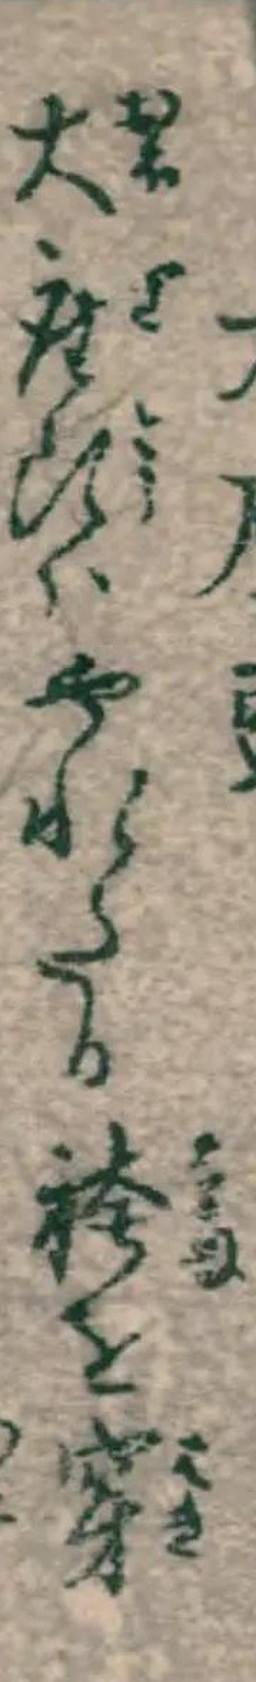大座頭はやれたる袴を穿
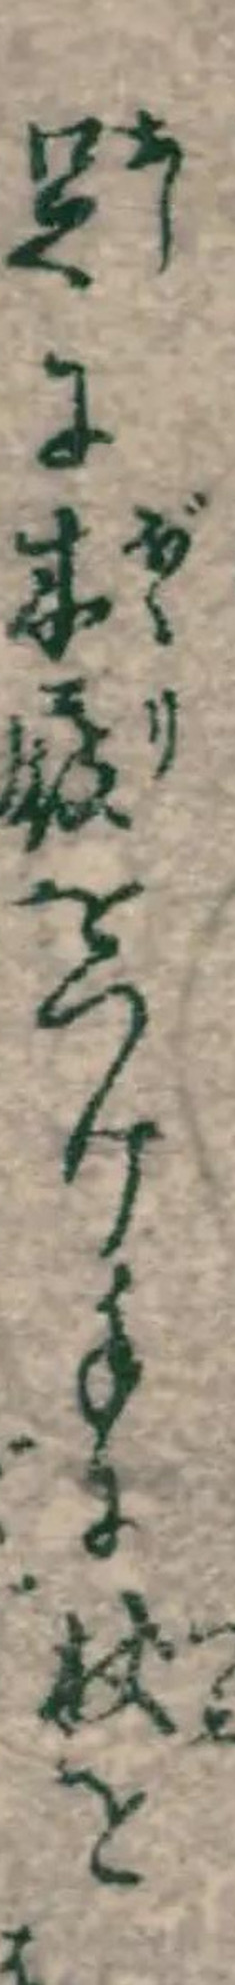足に木履をつけ手には杖を
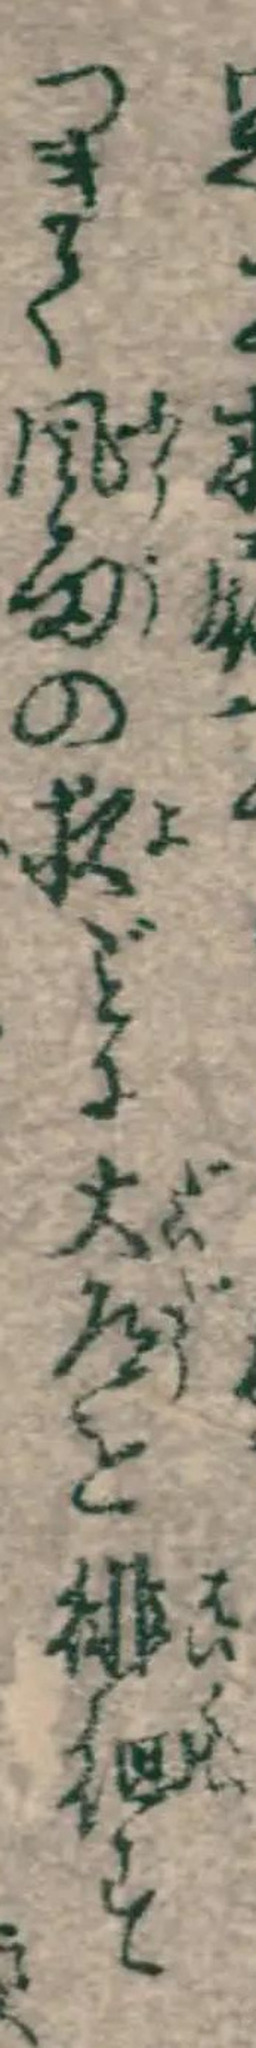つきて風雨の夜ごとに大道を徘徊す
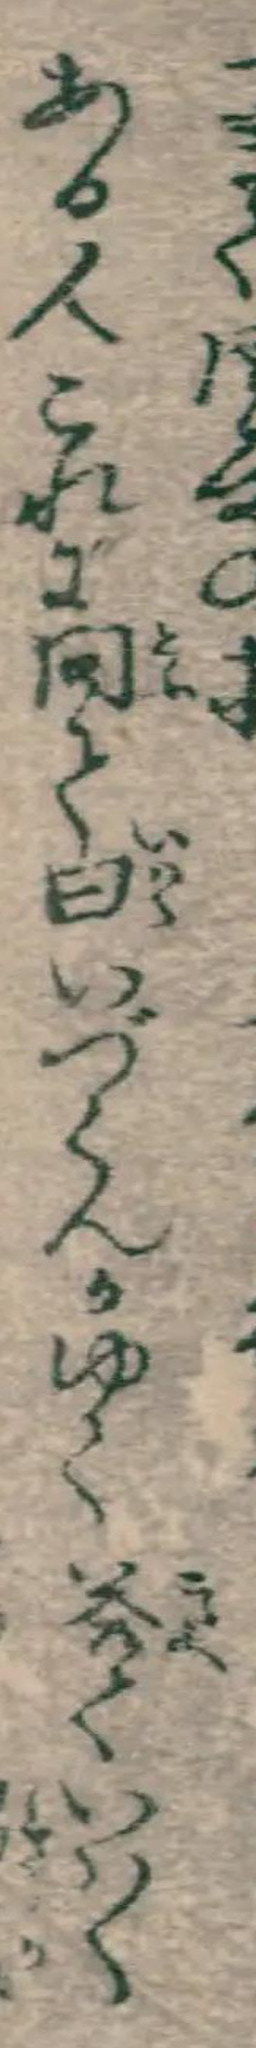ある人これに問て曰いづくんかゆく答ていはく
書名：百鬼夜行 3巻拾遺3巻. [2]
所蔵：国立国会図書館 National Diet Library, JAPAN
